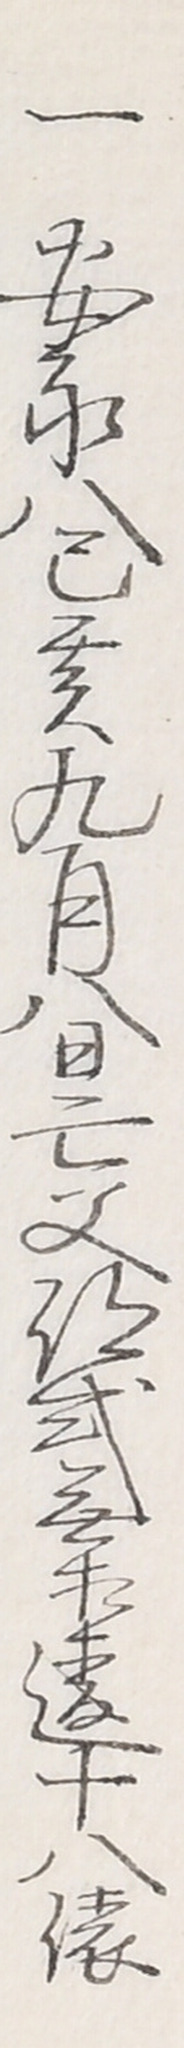一安永八己亥九月八日亡父跡式無相違十八俵
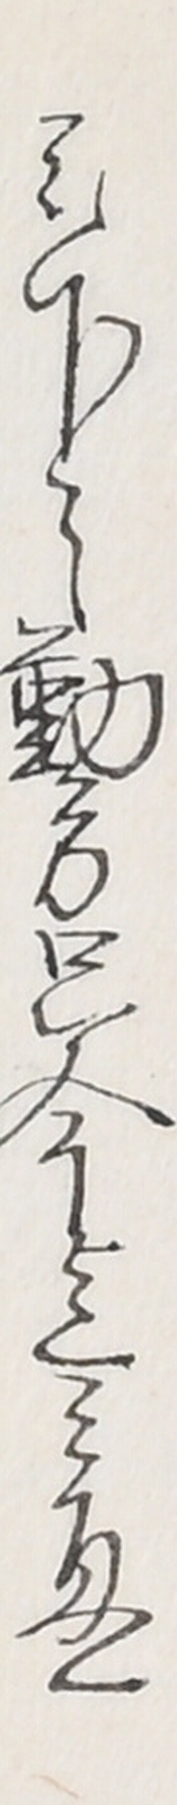被下之勤方只今迄之通
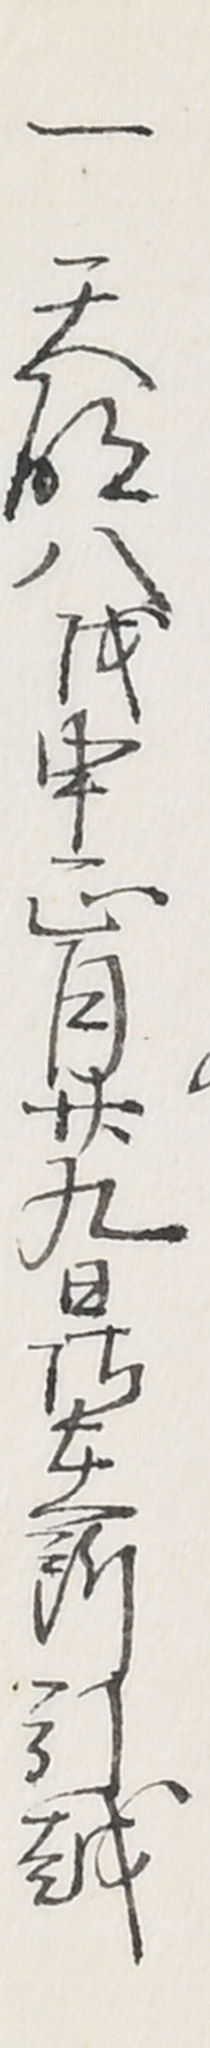一天明八戊申正月廿九日御在所引越
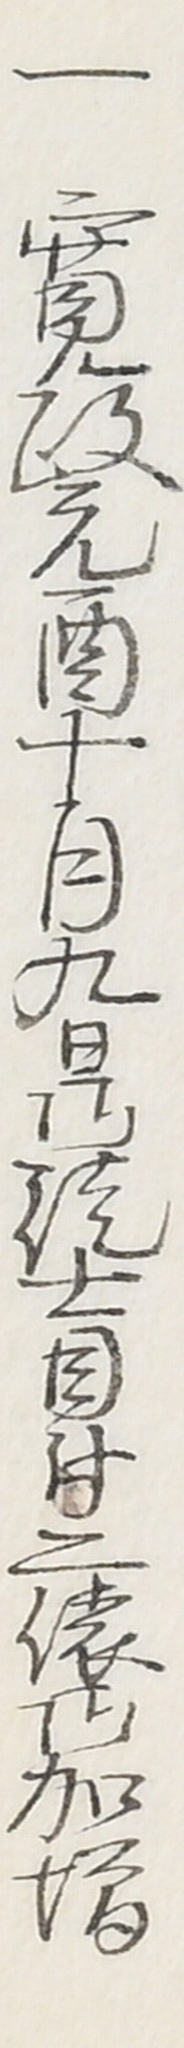一寛政元酉十月九日御徒士目付二俵御加増
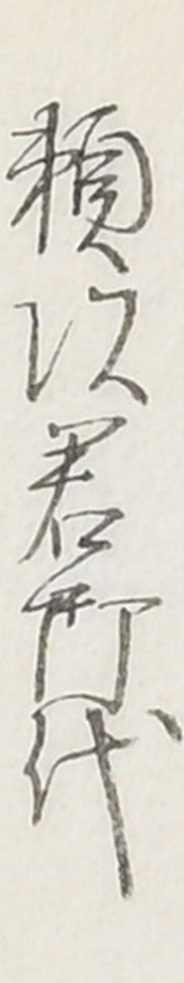頼以君御代
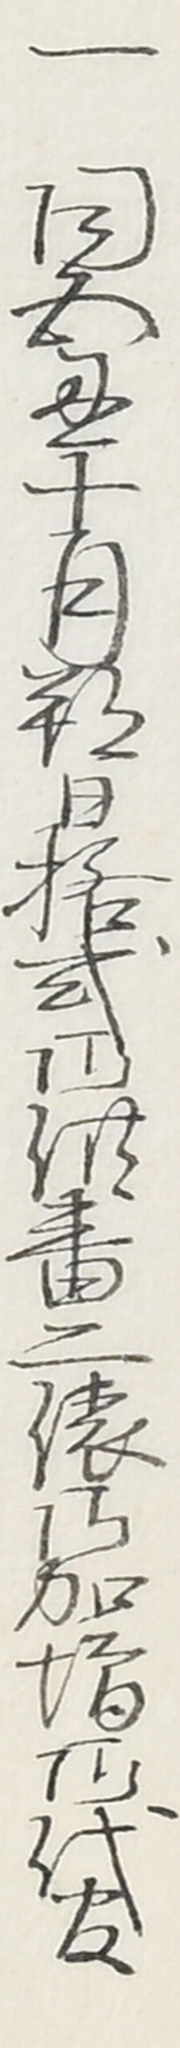一同五丑十月朔日格式御供番二俵御加増御代官
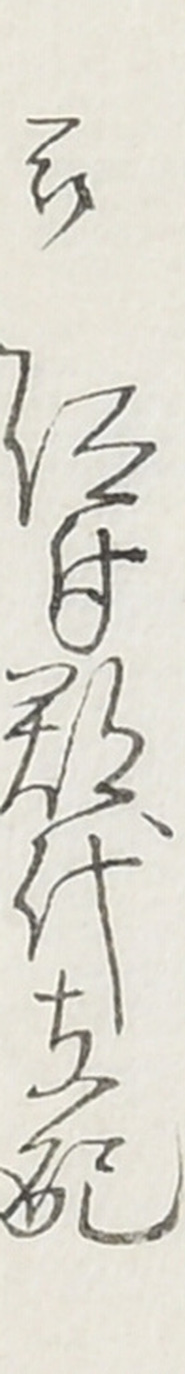被仰付郡代支配
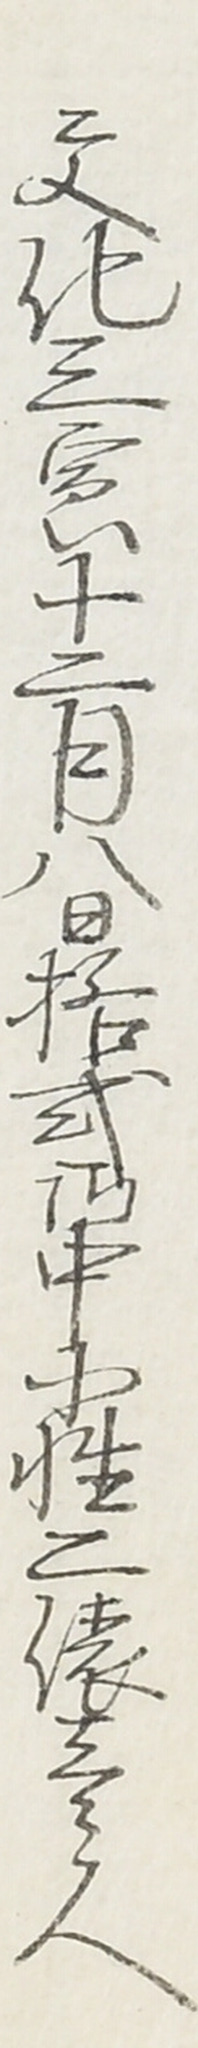一文化三寅十二月八日格式御中小性二俵壱人
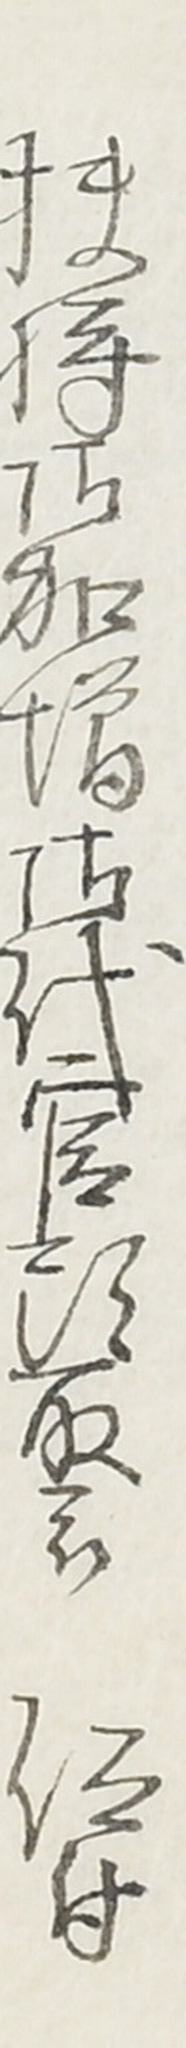扶持御加増御代官頭取被仰付
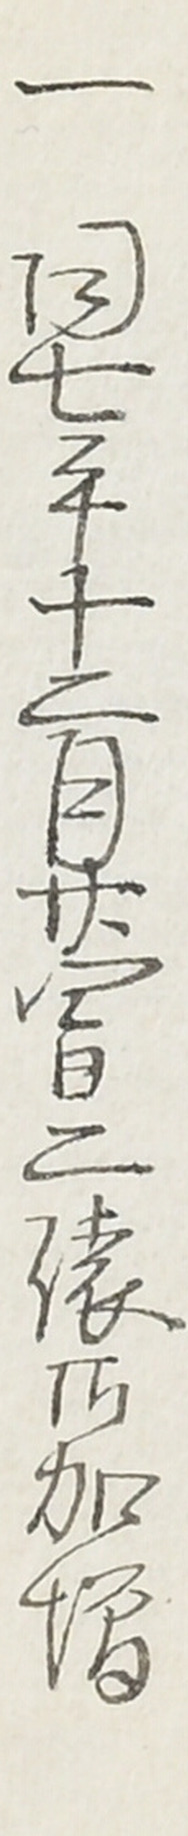一同七午十二月廿四日二俵御加増
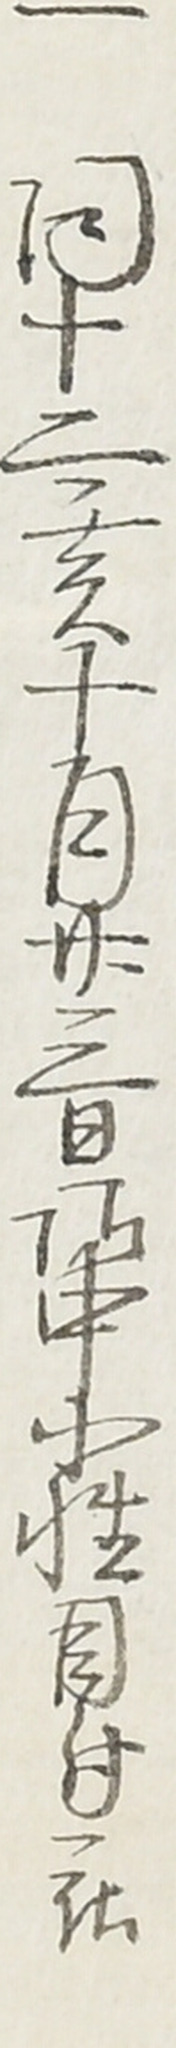一同十二亥十月廿三日御中小性目付被
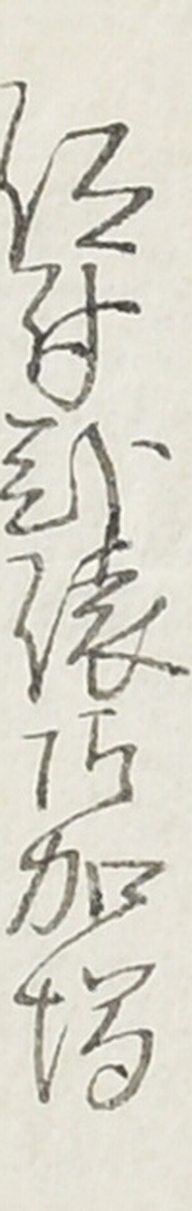仰付弐俵御加増
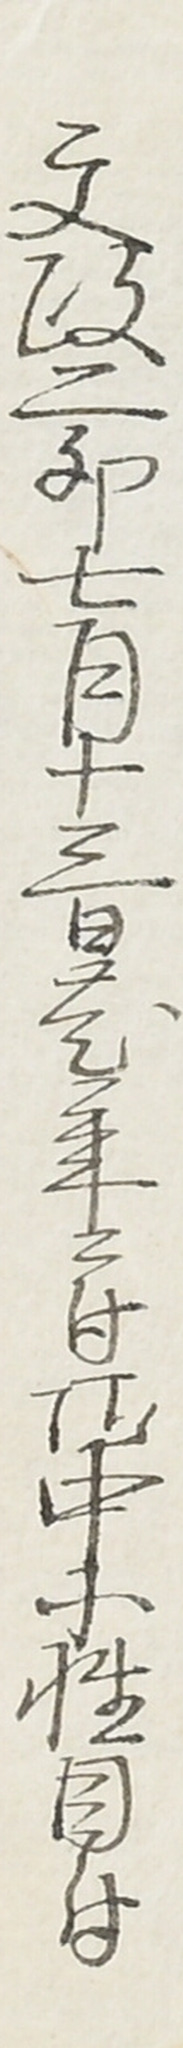一文政二卯七月十三日老年ニ付御中小性目付
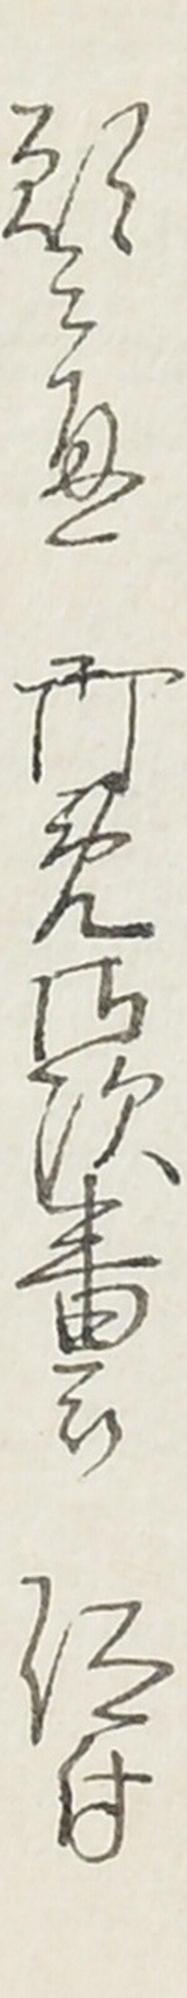願之通御免御次番被仰付
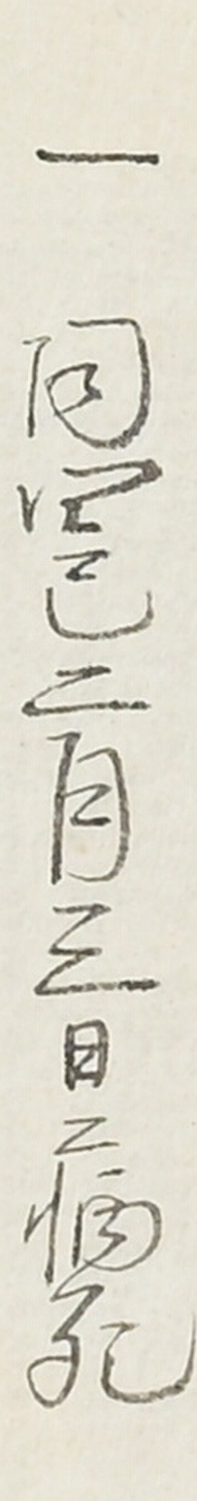一同四巳二月三日病死

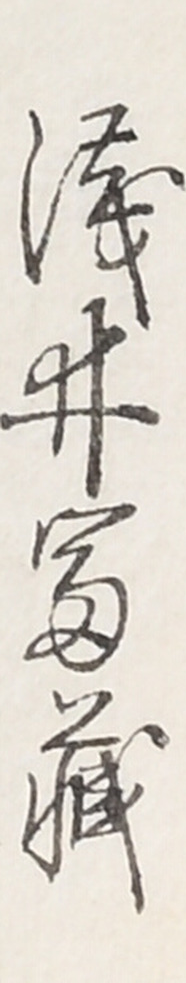浅井富蔵
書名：無足諸士勤仕録（四）
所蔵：伊那市立高遠町図書館・合同会社AMANE
